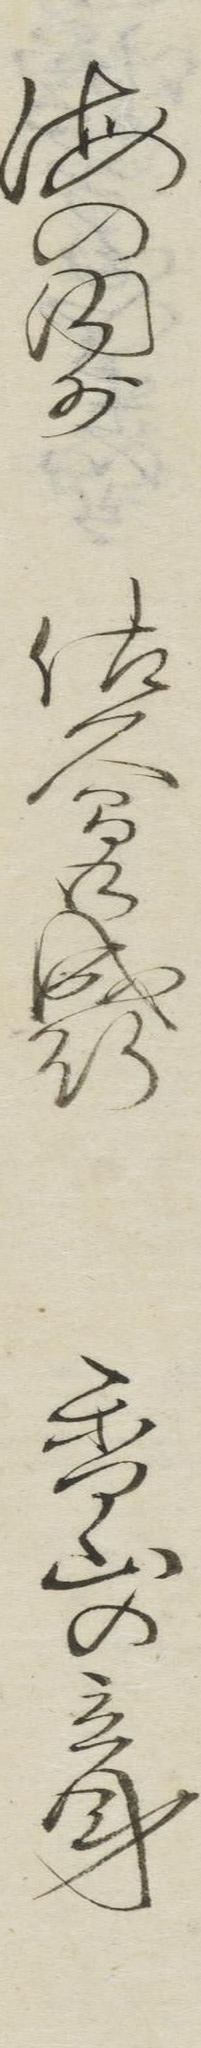海の内外佐久間の成行香山の立身
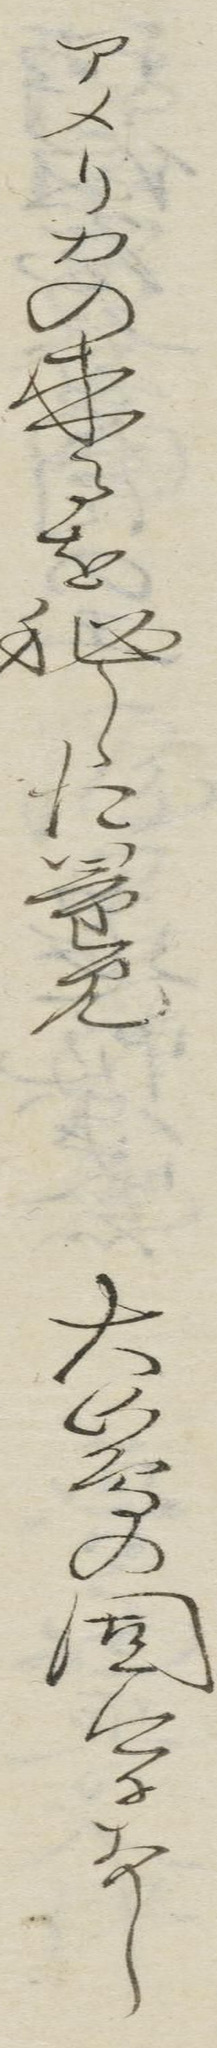アメリカの来るを秘した量見大嶌の固けるなし
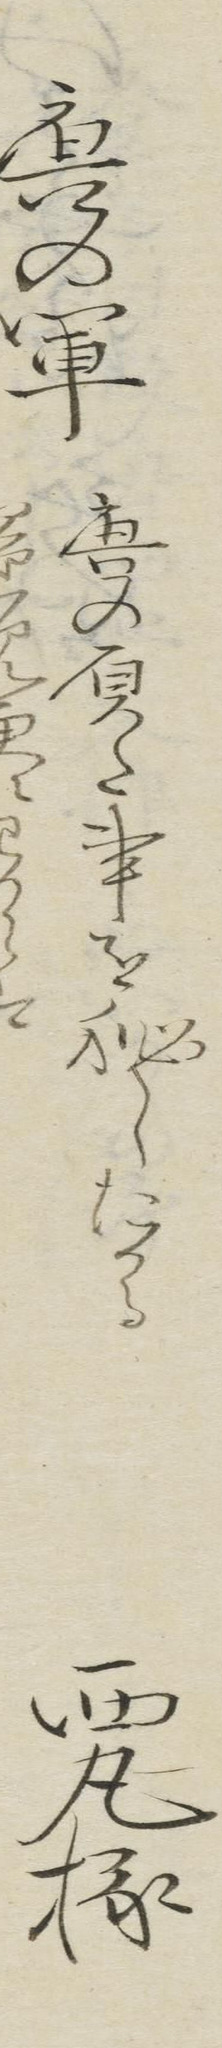唐の軍唐の負た事を秘したかる西丸様
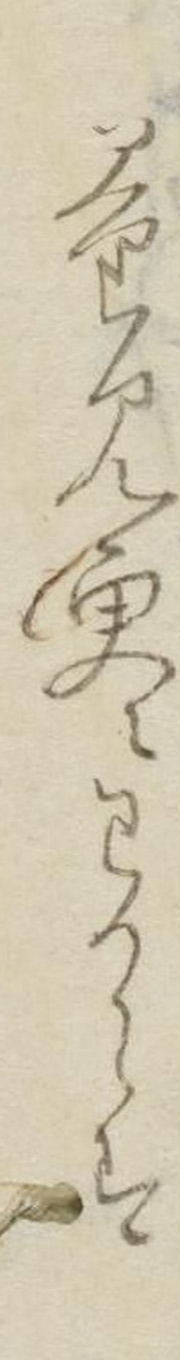量見更ニわからす
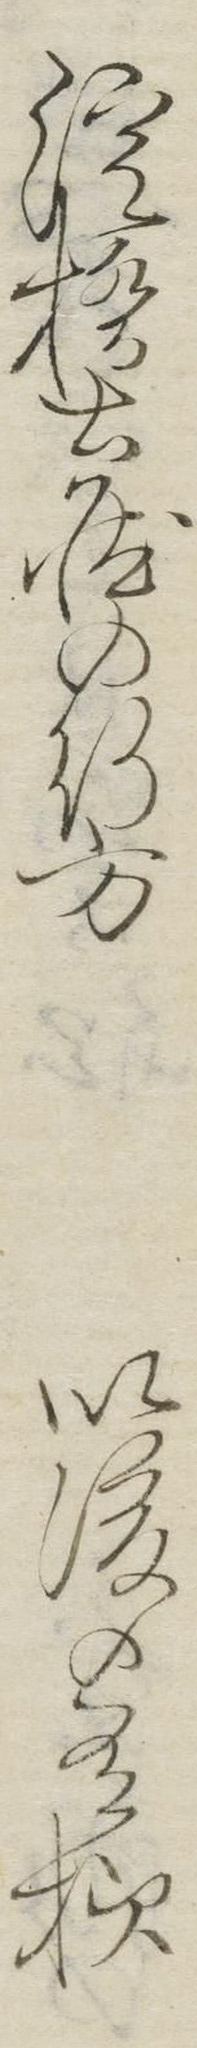浮橋土蔵の行方以後の有様
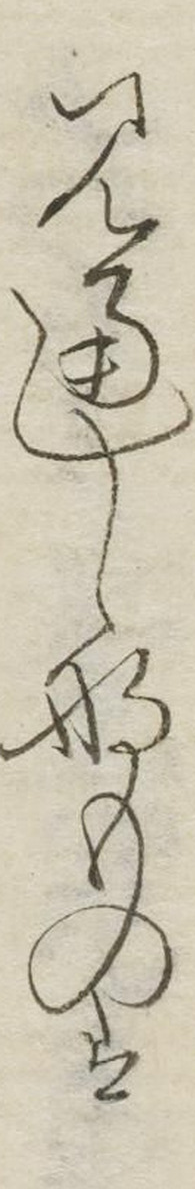見通しなものは
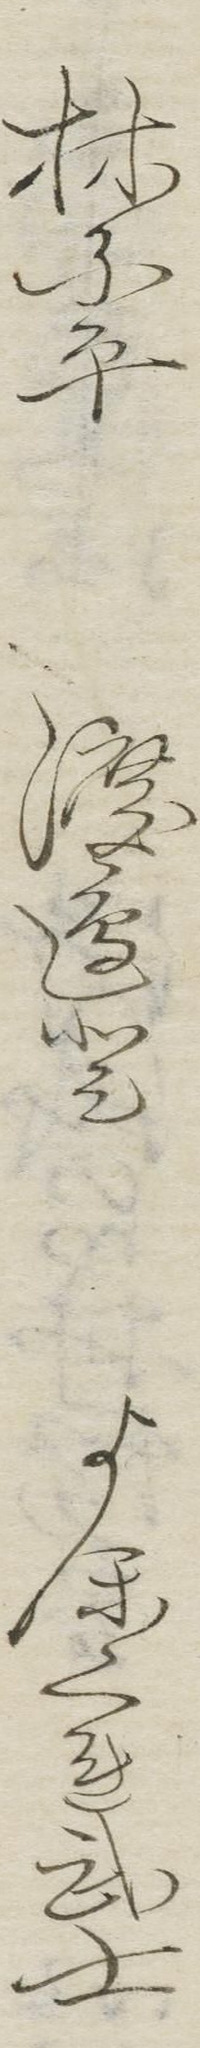林子平渡辺登よほくれ武士
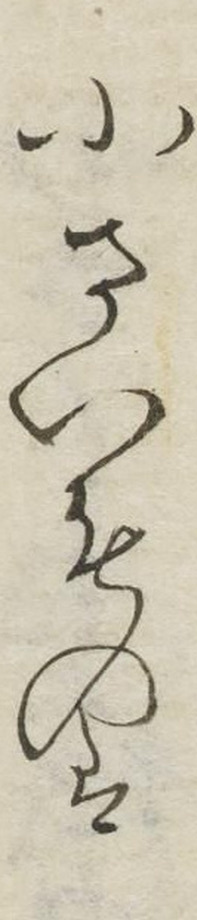小さいものは
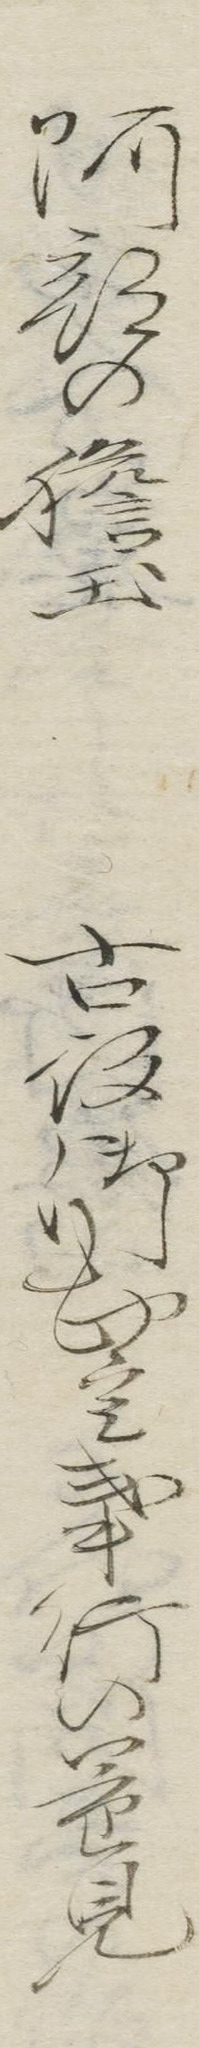阿部の膽玉古役御勘定奉行の量見
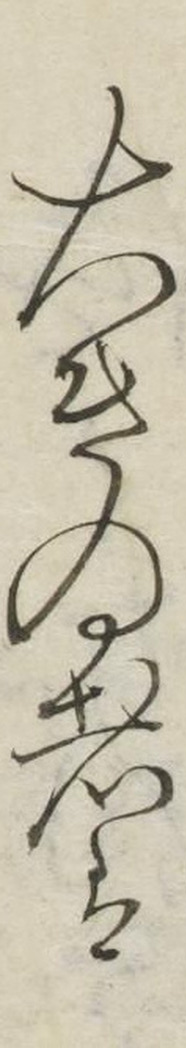大きい者は
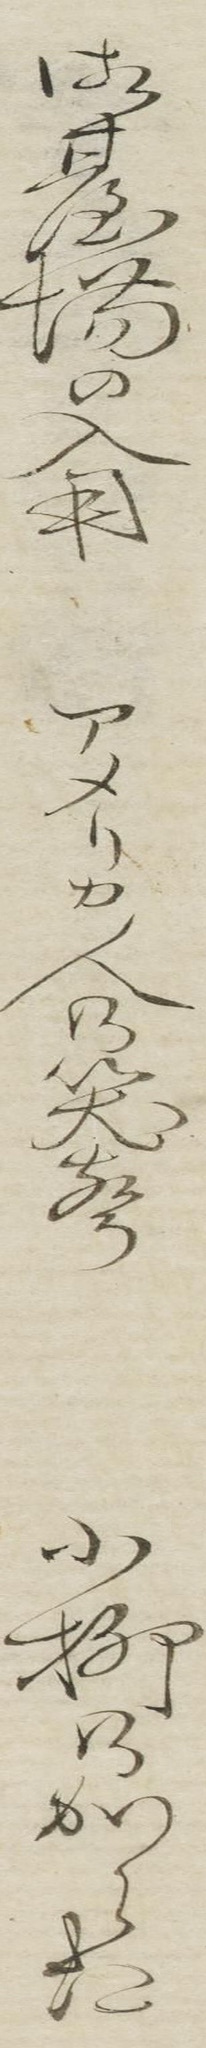お台場の入用アメリカ人の笑声小柳のからた

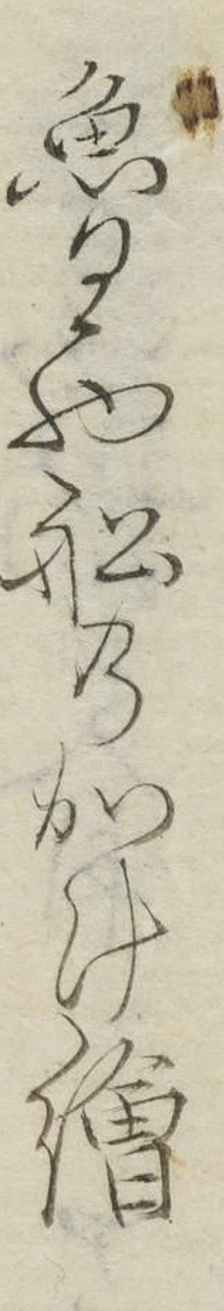魯西船のかけ絵
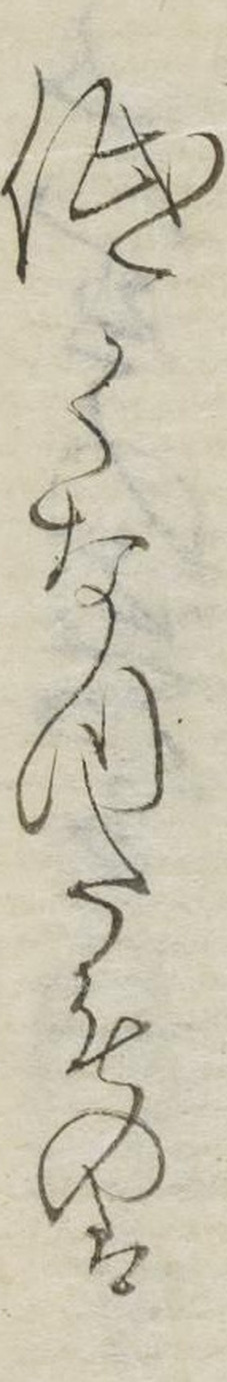低くなつたものは
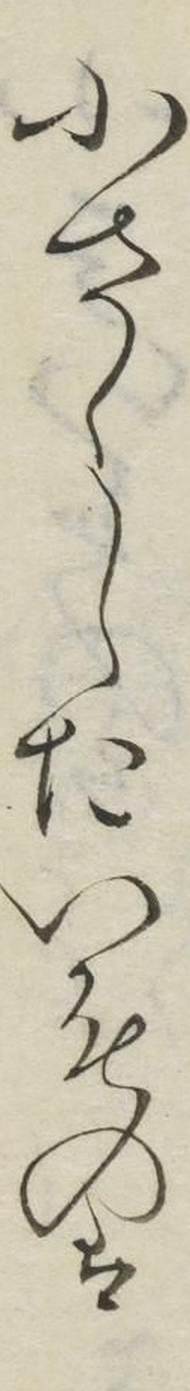小さくしたいものは
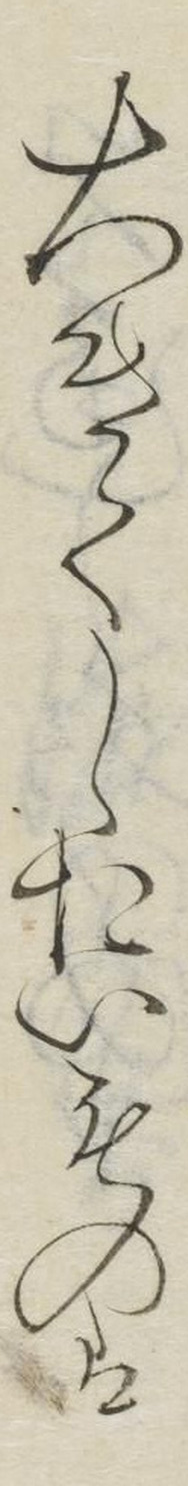大きくしたいものは
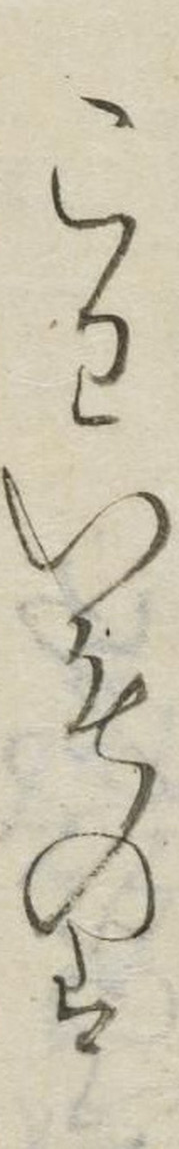こわいものは
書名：大地震實録
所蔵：東京大学地震研究所図書室 Earthquake Research Institute Library, The University of Tokyo, JAPAN
